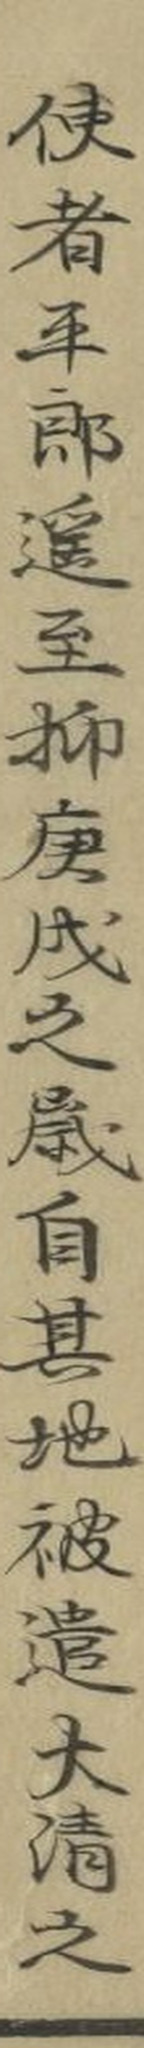使者平郎遥至抑庚戌之歳自其地被遣大清之
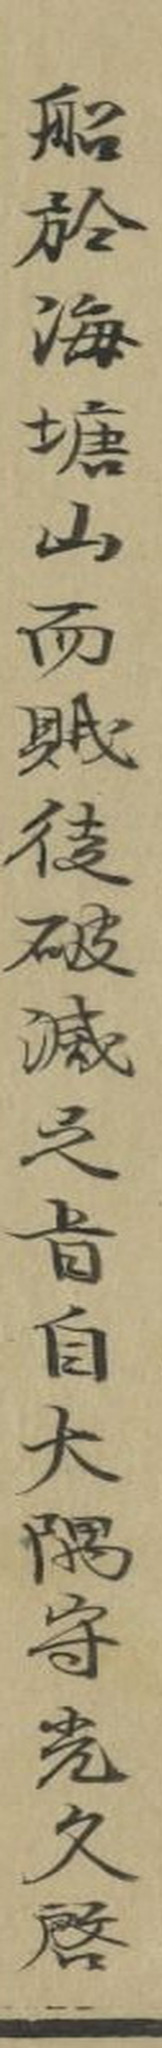舩於海塘山而賊徒破滅之旨自大隅守光久啓
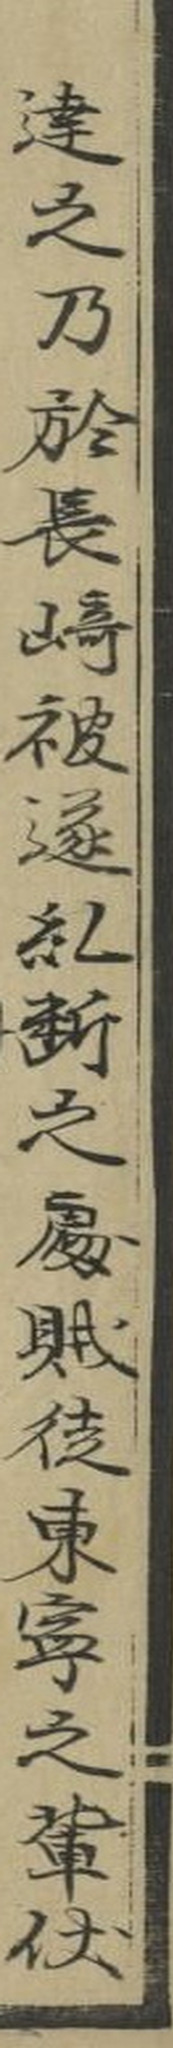達之乃於長崎被遂糺断之處賊徒東寧之輩伏
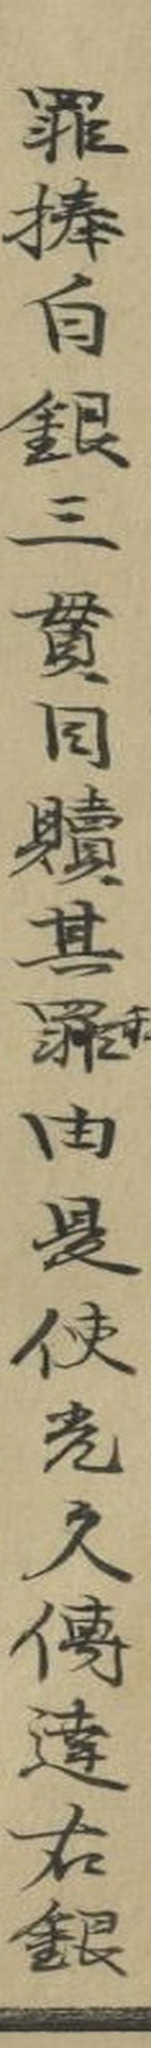罪捧白銀三百貫目贖其罪由是使光久伝達右銀
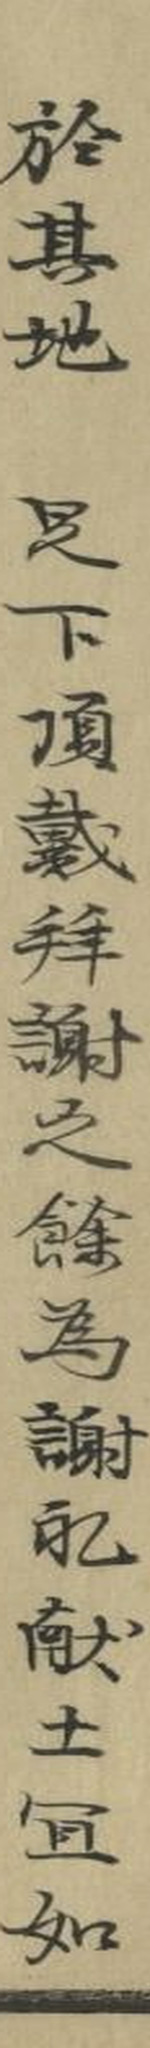於其地足下頂戴拝謝之余為謝礼献土冝如
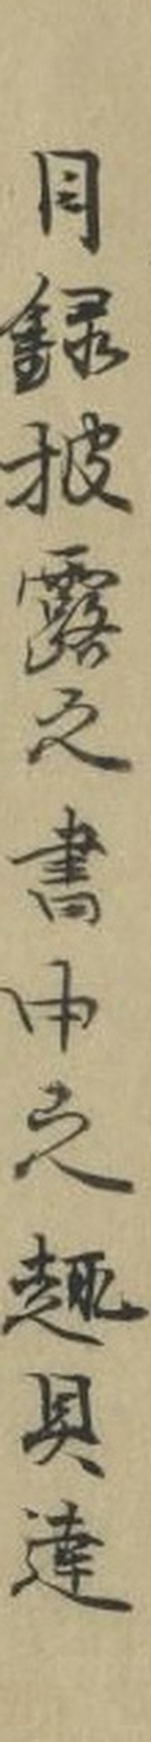目録披露之書中之趣具達
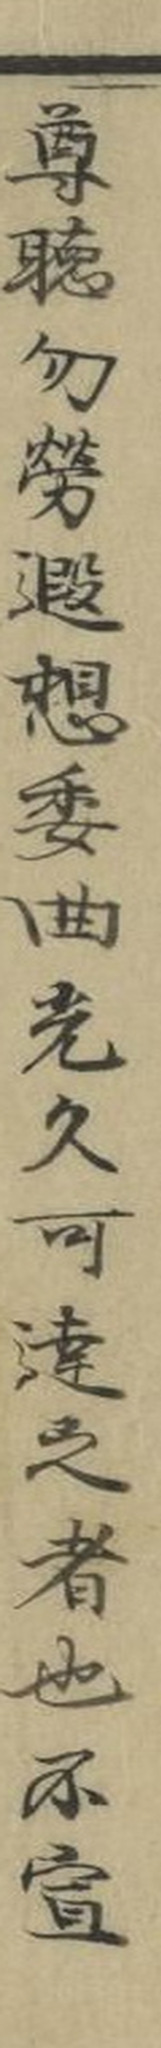尊聴勿遐想委曲光久可達之者也不宣
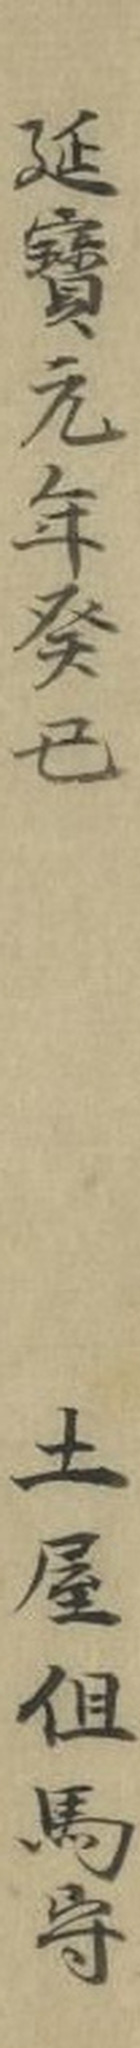延宝元年癸丑土屋但馬守
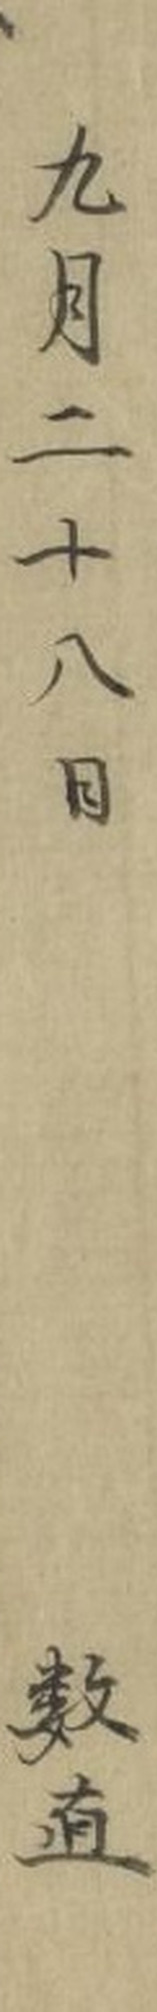九月二十八日数直
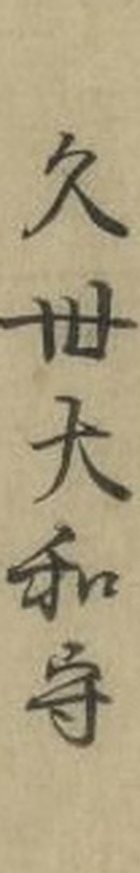久世大和守

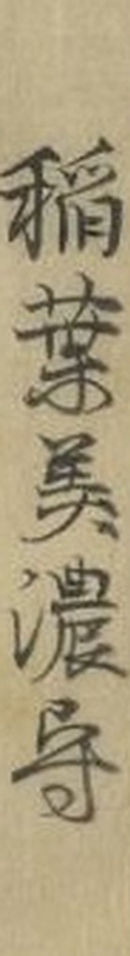稲葉美濃守
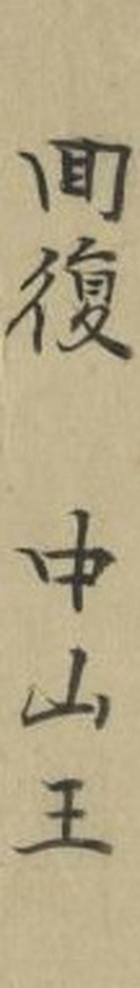回復中山王
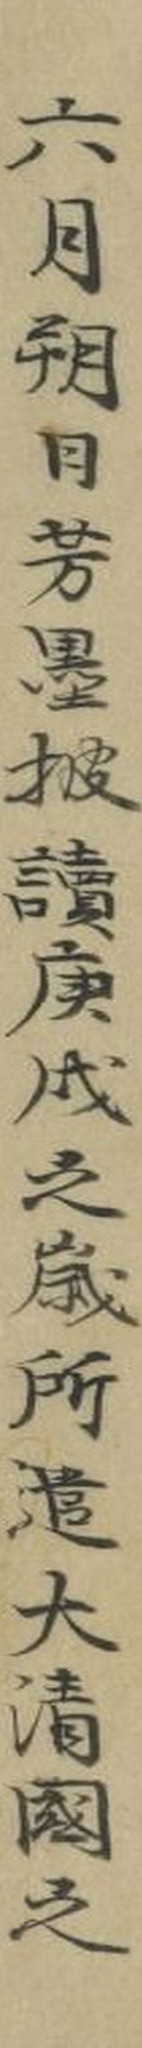六月朔日芳墨披読庚戌之歳所遣大清国之
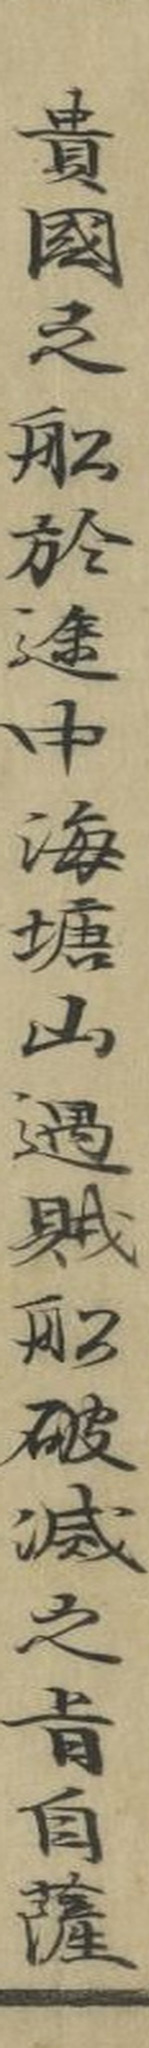貴国之舩於途中海塘山遇賊舩破滅之旨自薩
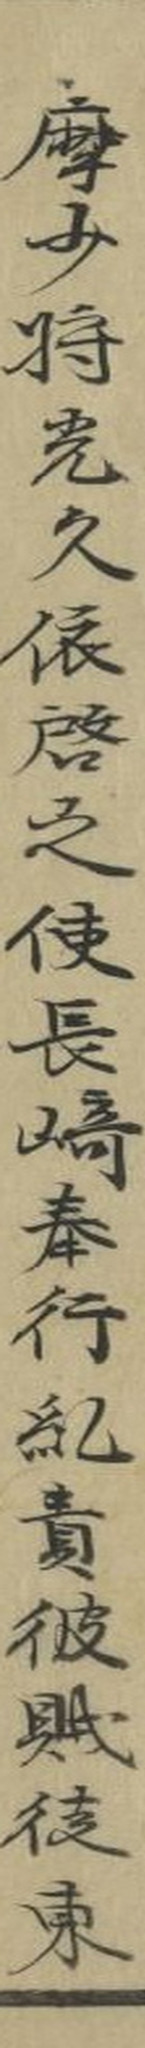摩少将光久依啓之使長崎奉行糺責彼賊徒東
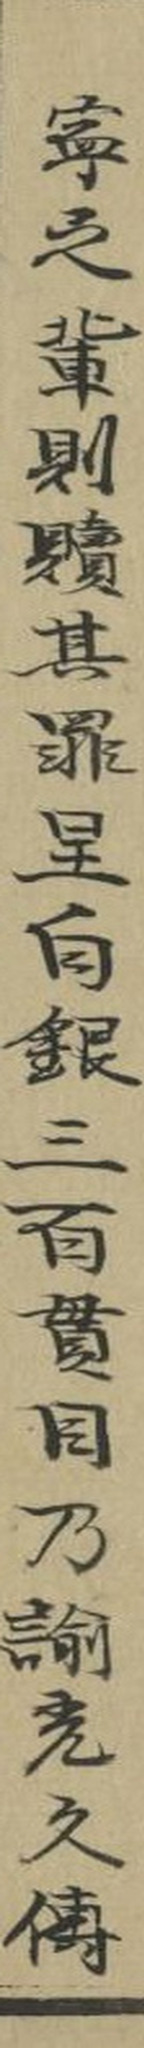寧之輩則贖其罪呈白銀三百貫目乃諭光久伝
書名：琉球往来（下）
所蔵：University of the Ryukyus Library
